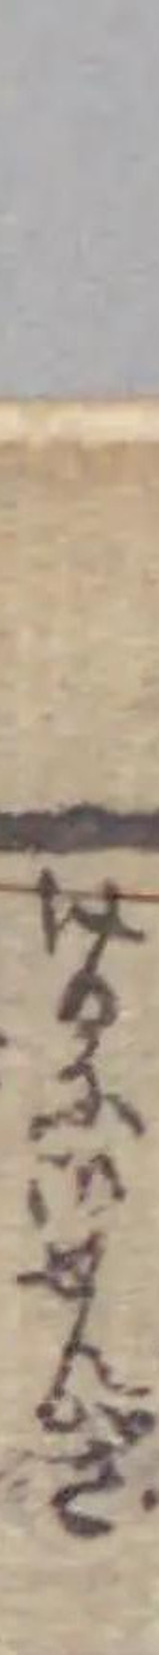けるに御せんぎ
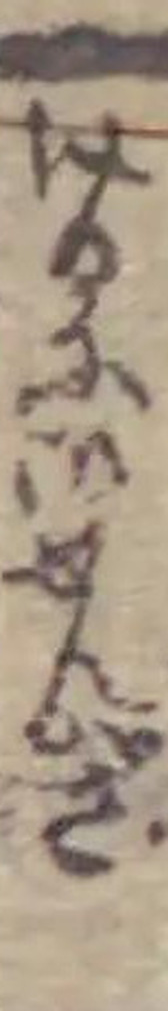けるに御せんぎ
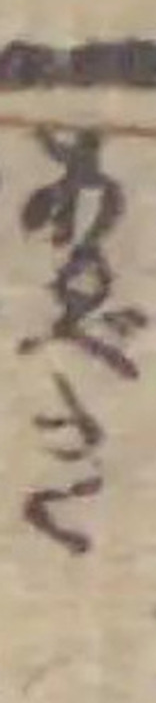あるべき
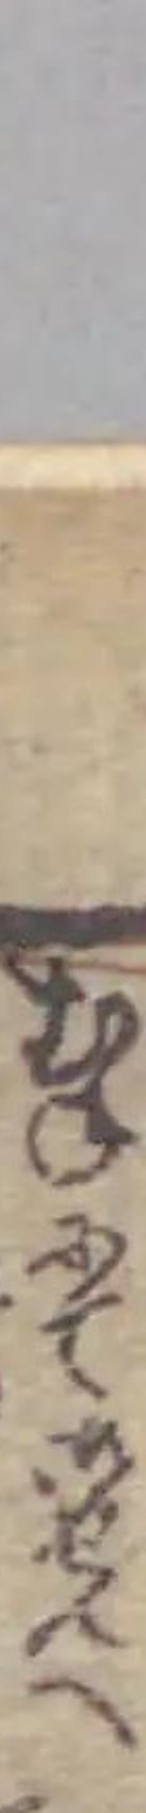むねにて御ぜんへ
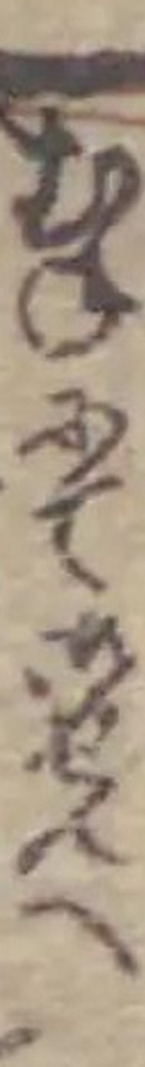むねにて御ぜんへ
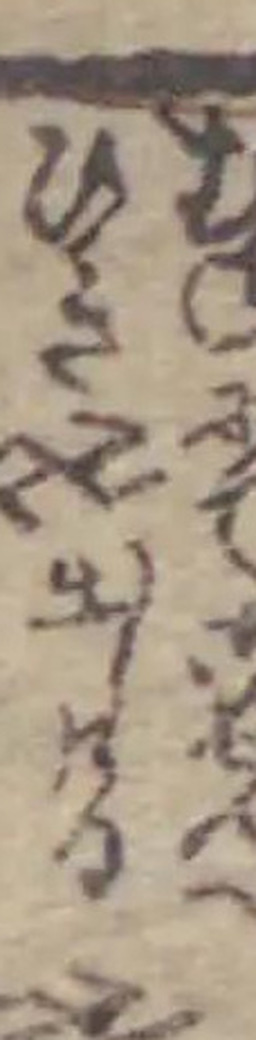ひき出しける
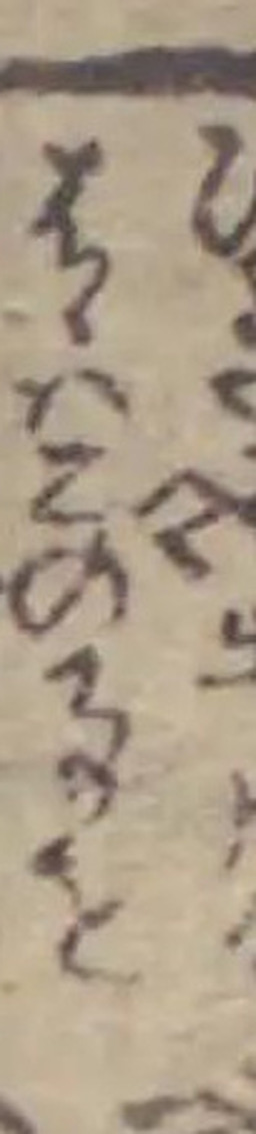はゝはこの事を
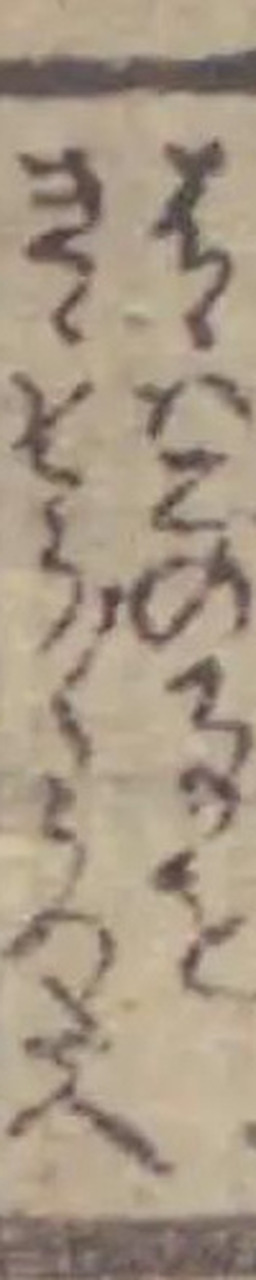きゝそう〳〵うつたえ
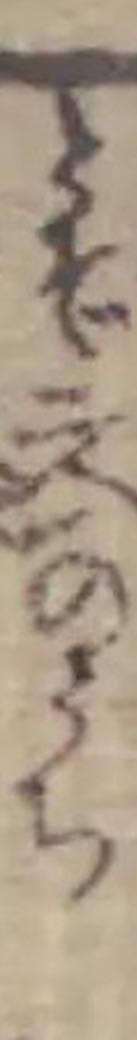とぞ二人のうち
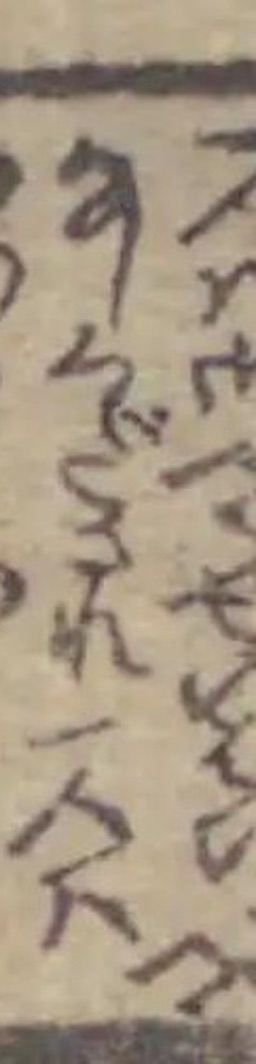なしくだされ一人は
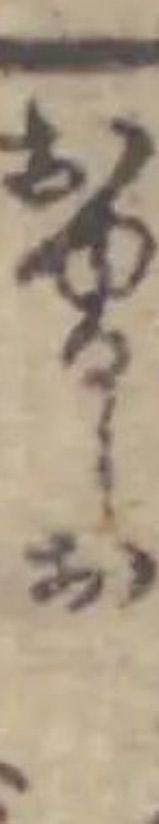おゆるしを
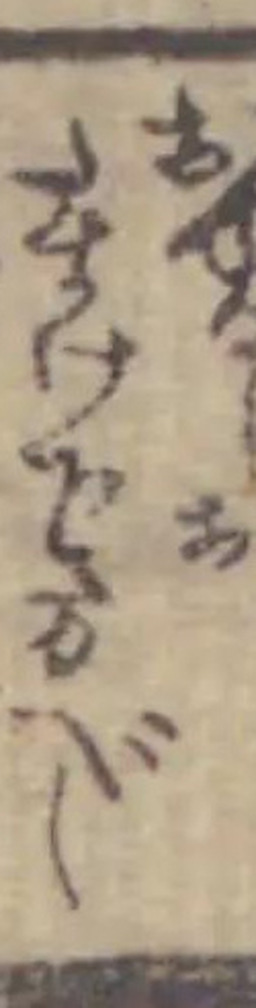たまけ下さるべし
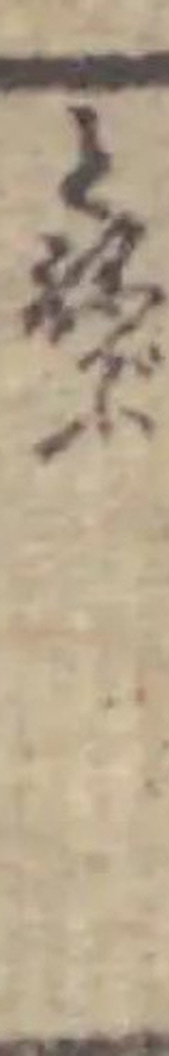とねがふ
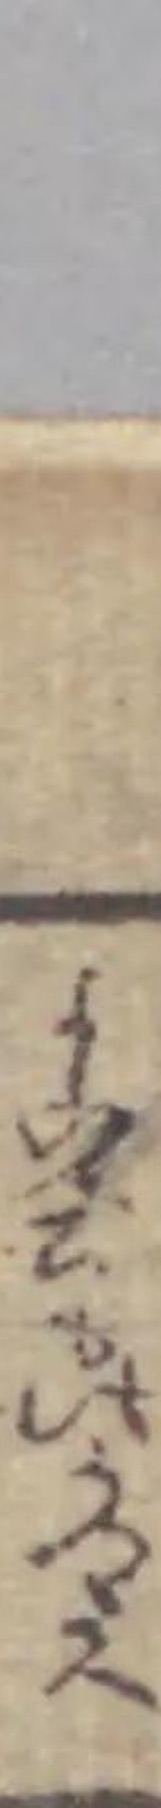よしいへ公も此うつたへ
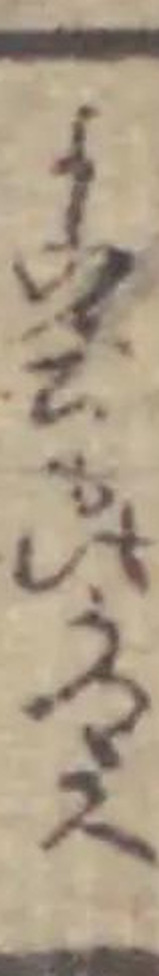よしいへ公も此うつたへ
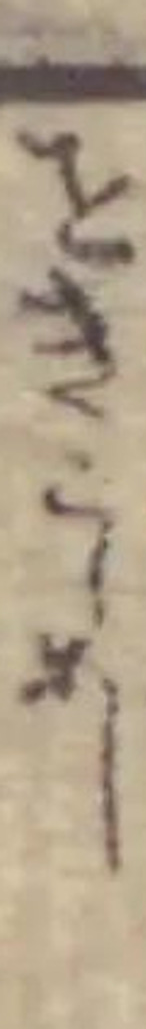をきこしめし
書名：奥州咄 3巻
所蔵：国立国会図書館 National Diet Library, JAPAN
